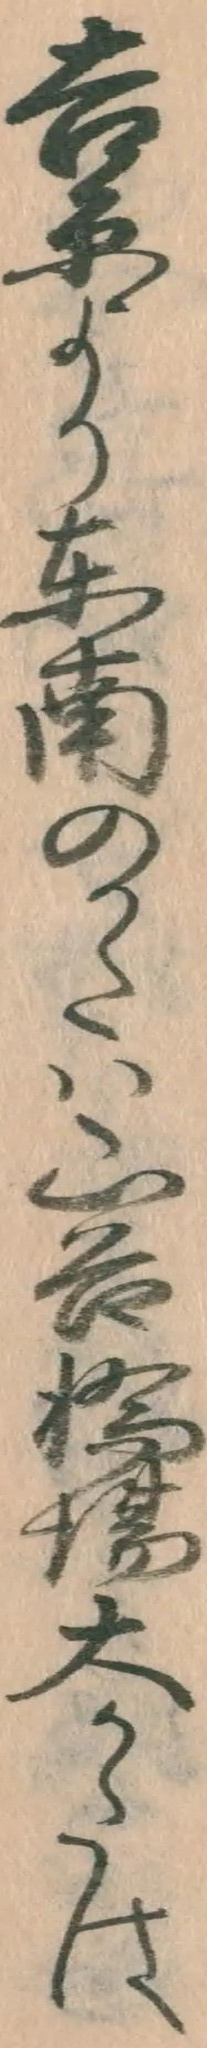吉原より東南のかたハ山谷橋場大かたは
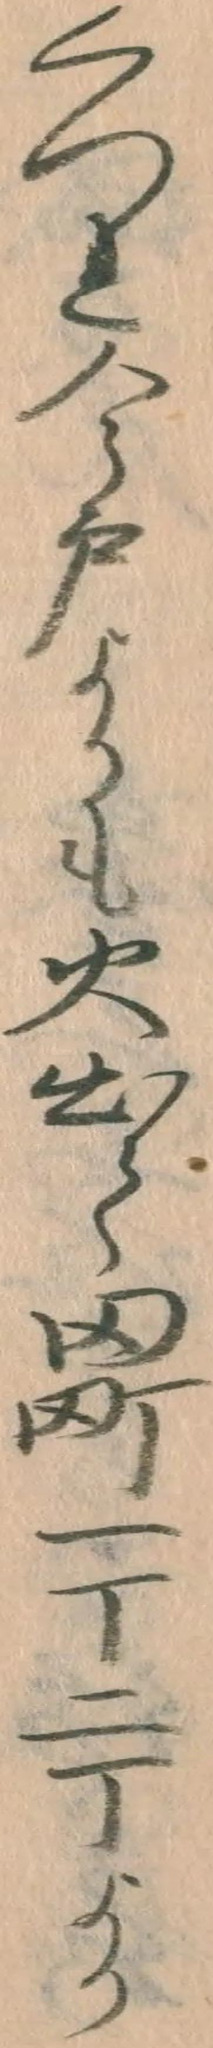くつれ今戸よりも火出て田町一丁二丁より
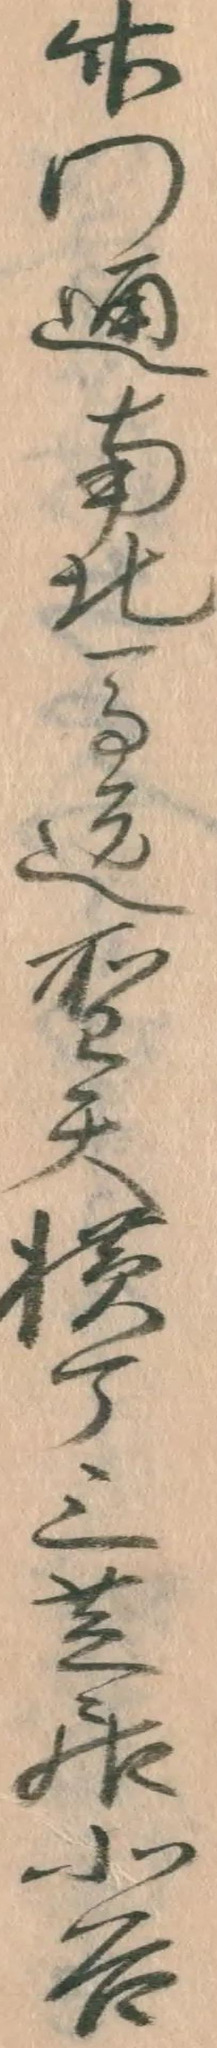竹川通南北馬道聖天横丁三芝居北谷
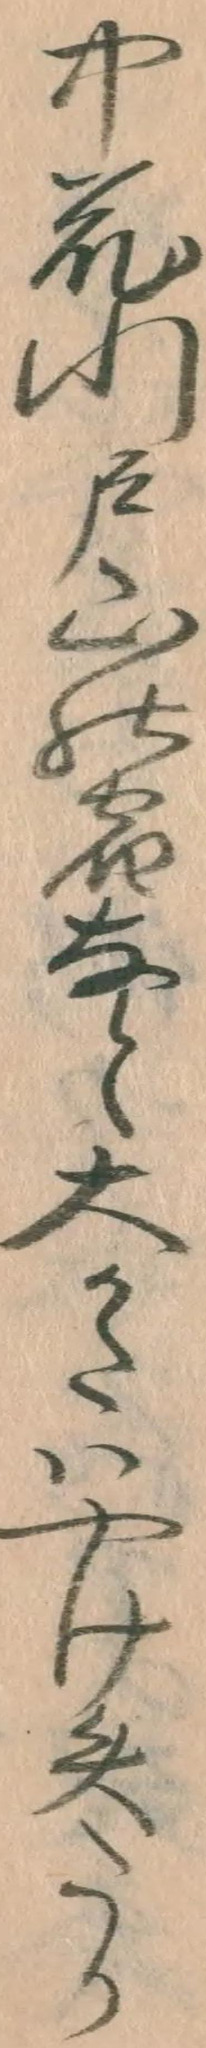中花川戸山の宿なと大かたハやけ失たり
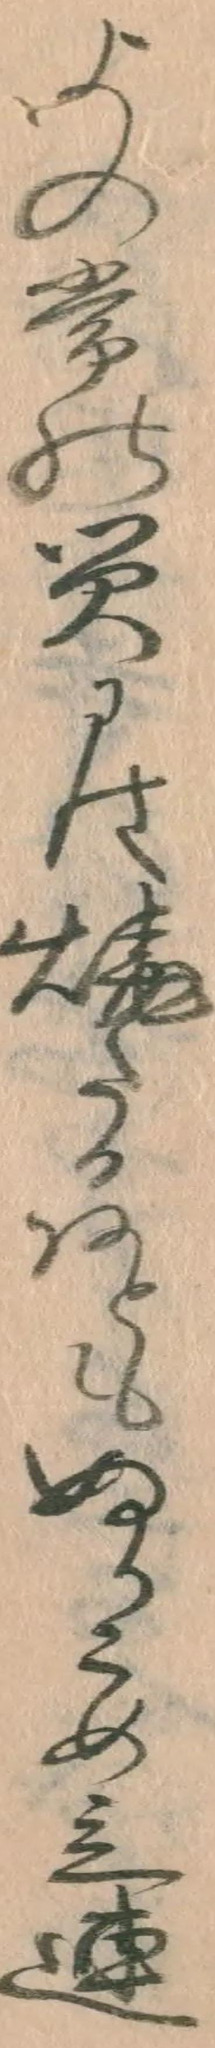よの常の災には燒たるあともぬりこめ立連
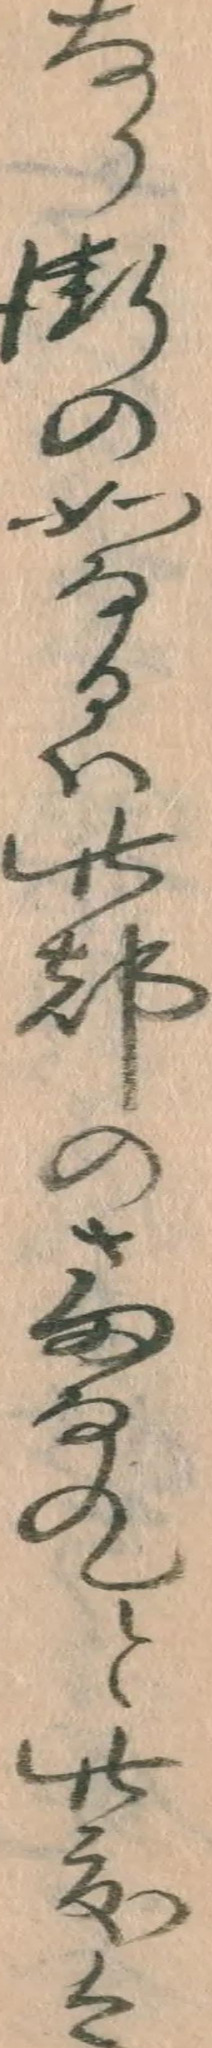なり街の如なるハ此都のさまなれと此度は
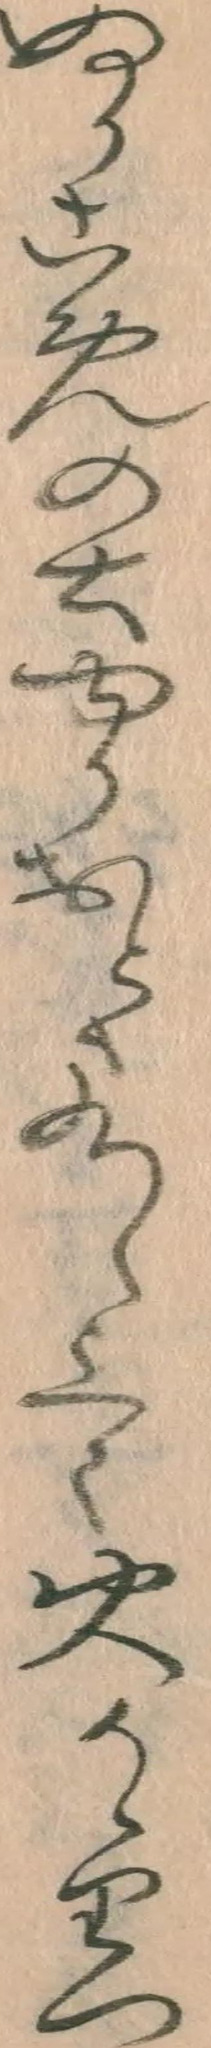ぬりこめの土ゆりおとされし上に火かヽりつ
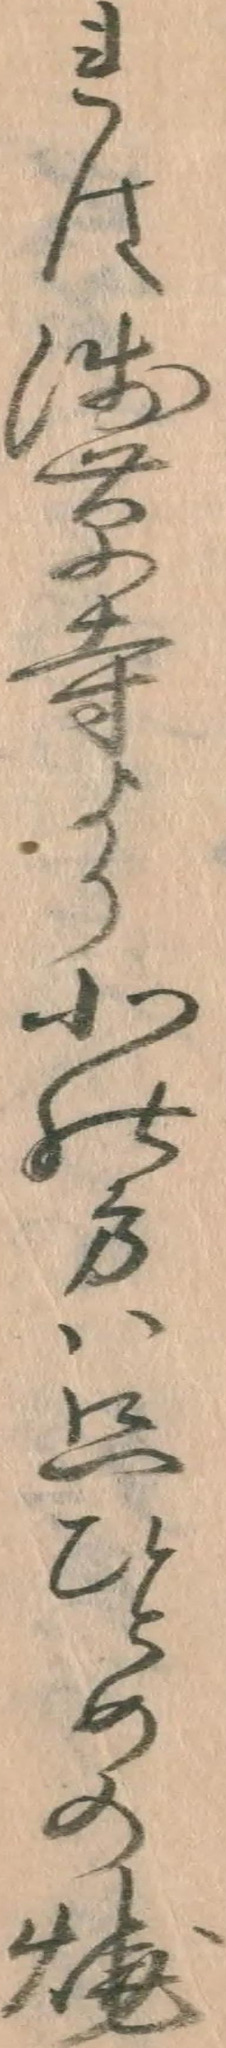れは浅草寺より北の方ハ只ひとめの燒
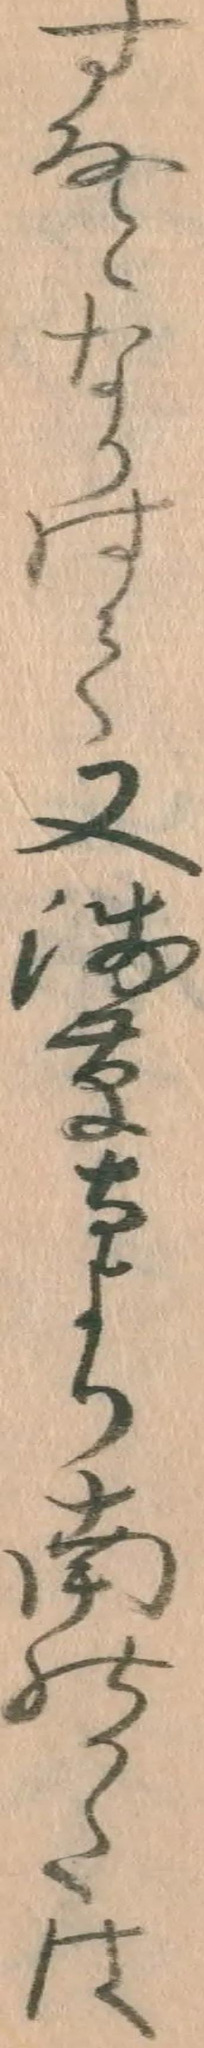すなとなりはて又浅草寺より南のかたは
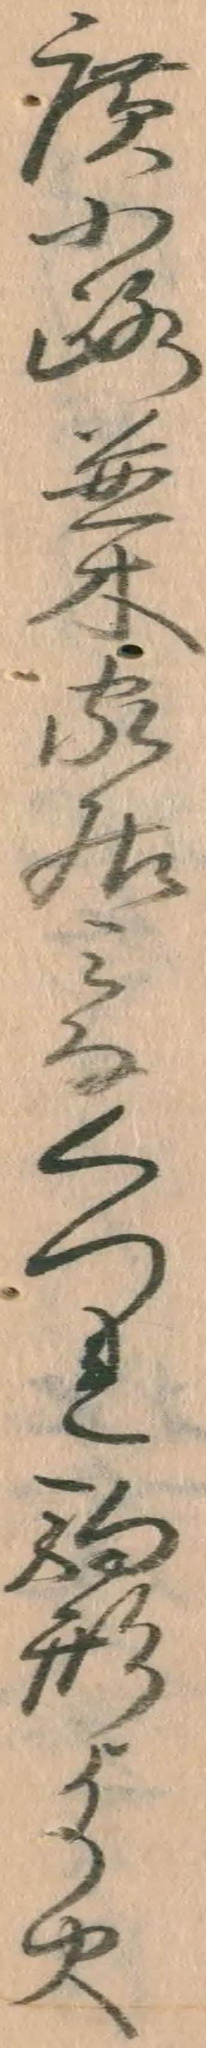廣小路並木家居ミなくつれ駒形より火
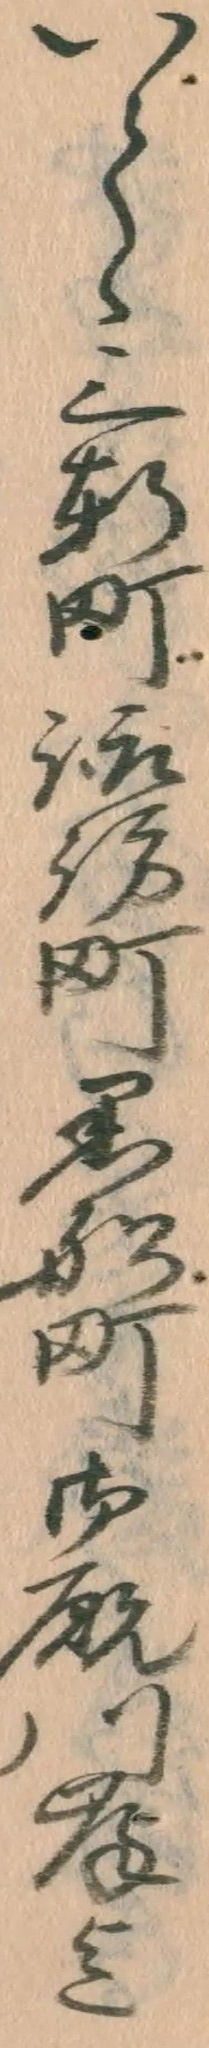いてゝ三軒町諏訪町黒船町御厩川岸迄
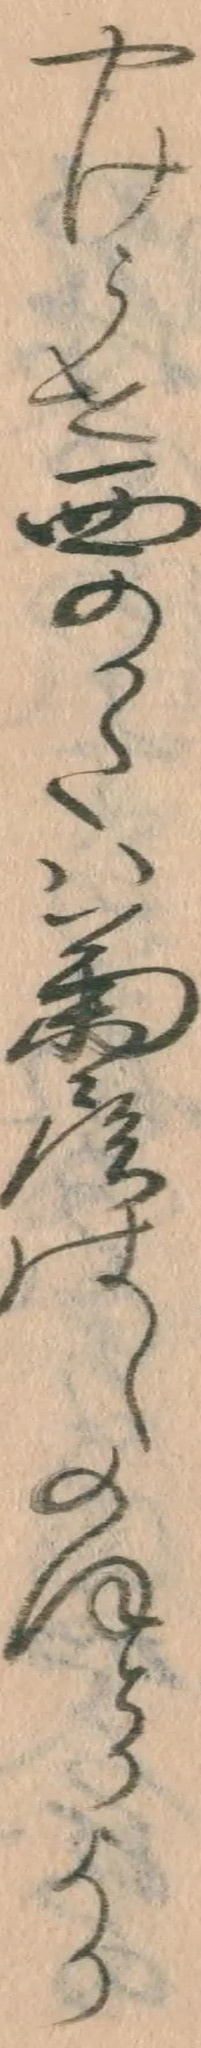やけうせ西のかたハ菊屋はしのほとりより
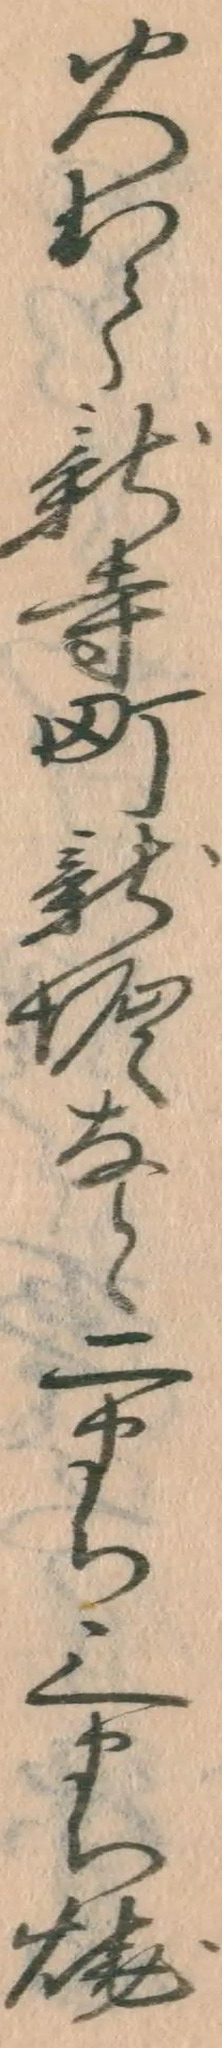火出て新寺町新堀なとニまち三まち燒
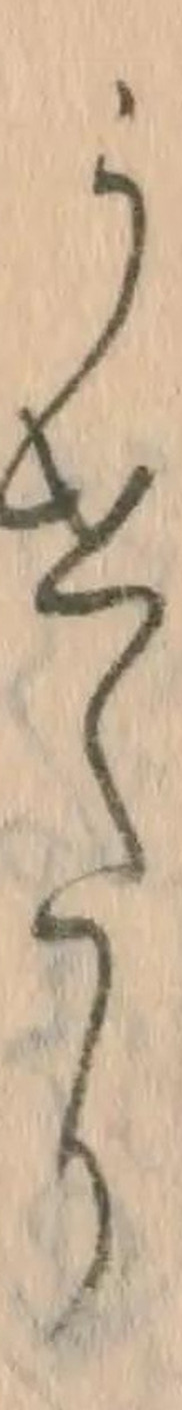うせたり
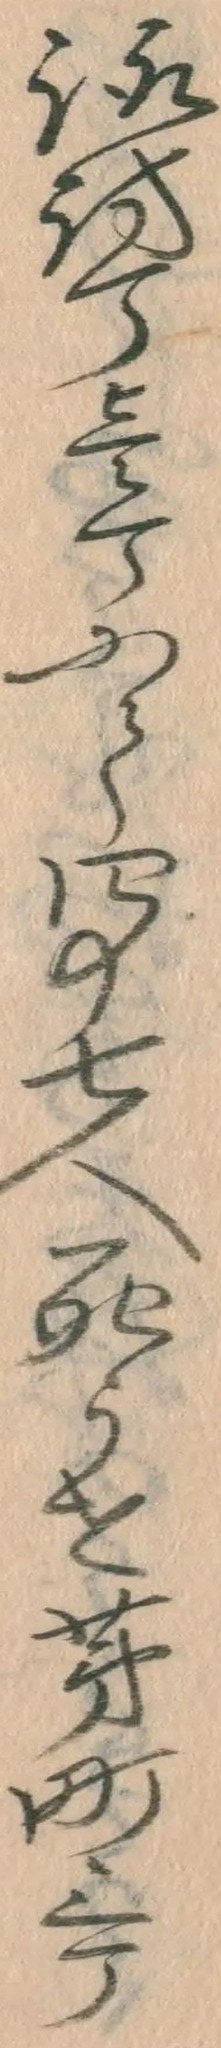諏訪丁壱丁にて四十七人死うせ茅町三丁
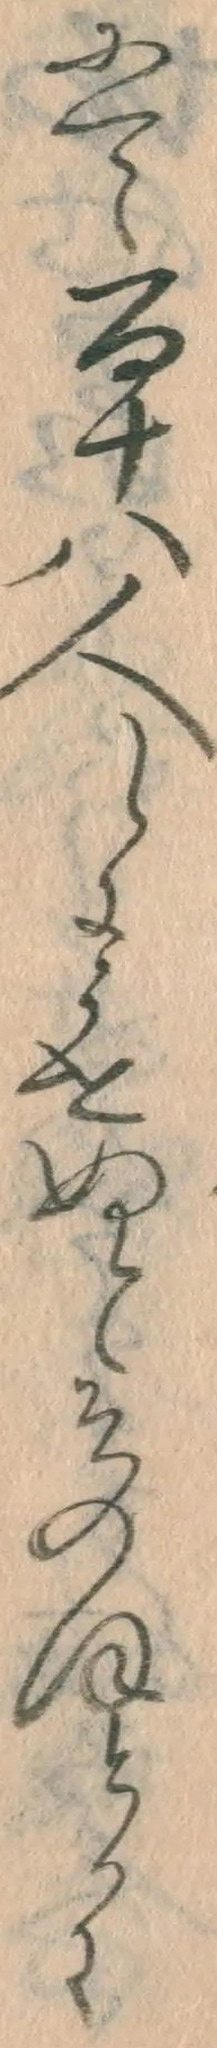にて百十八人しにうせぬとそのほとりに
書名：麗斎叢書. 20
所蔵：国立国会図書館 National Diet Library, JAPAN
